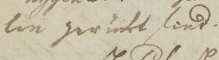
len gerückt sind.
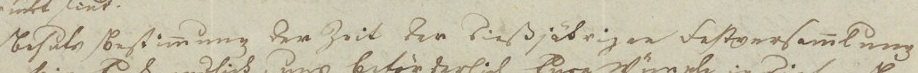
Behufs Bestimmung der Zeit der dießjährigen Festversammlung
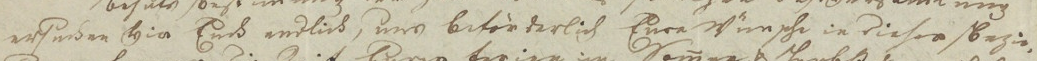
ersuchen wir Euch endlich, uns beförderlich Eure Wünsche in dieser Bezie-
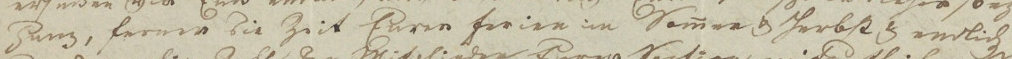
hung, ferner die Zeit Eurer Ferien im Sommer & Herbst & endlich
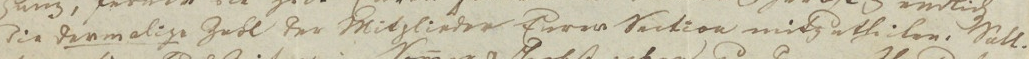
die dermalige Zahl der Mitglieder Eurer Section mitzutheilen. Soll-
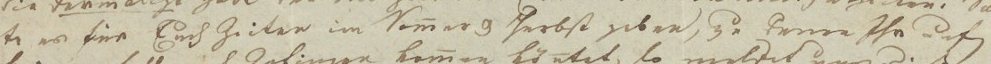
te es für Euch Zeiten im Sommer & Herbst geben, zu denen Ihr auf
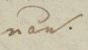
nau.
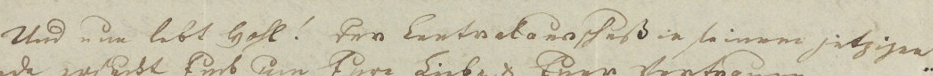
Und nun lebt wohl! Der Centralausschuß in seinem jetzigen
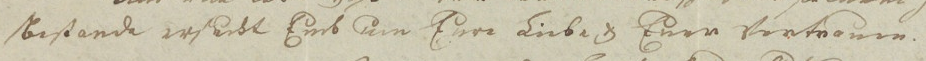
Bestande ersucht Euch um Eure Liebe & Euer Vertrauen.
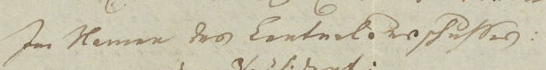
Im Namen des Centralausschusses:
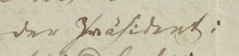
der Präsident:
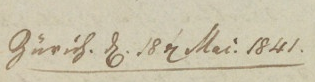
Zürich. d. 18ten Mai.
